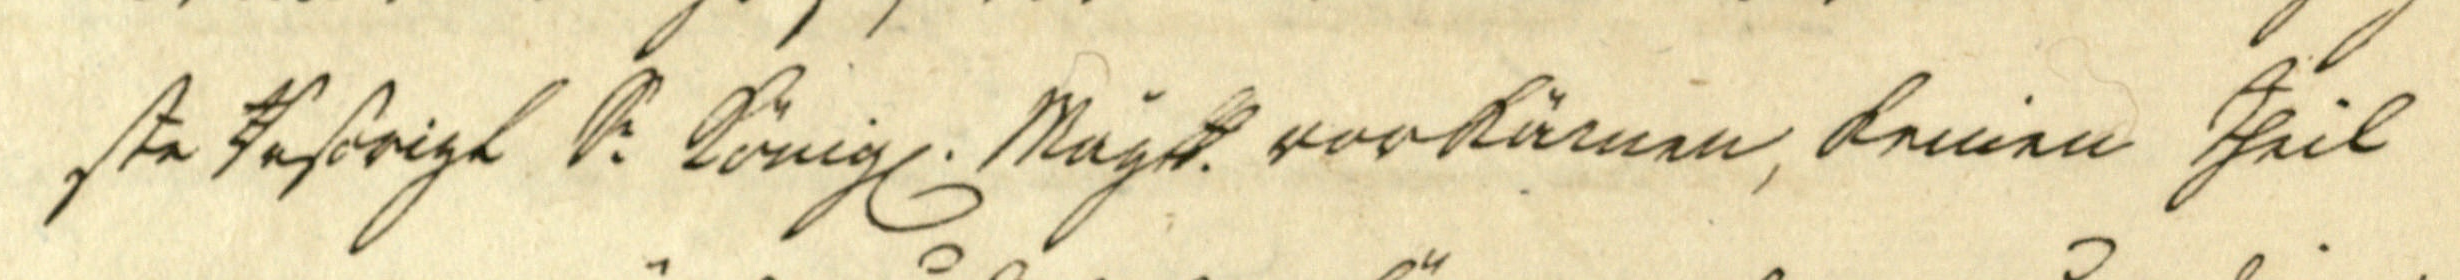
ste Rescript Sr. Königl. Maÿtt. vorkämen, keinen Theil
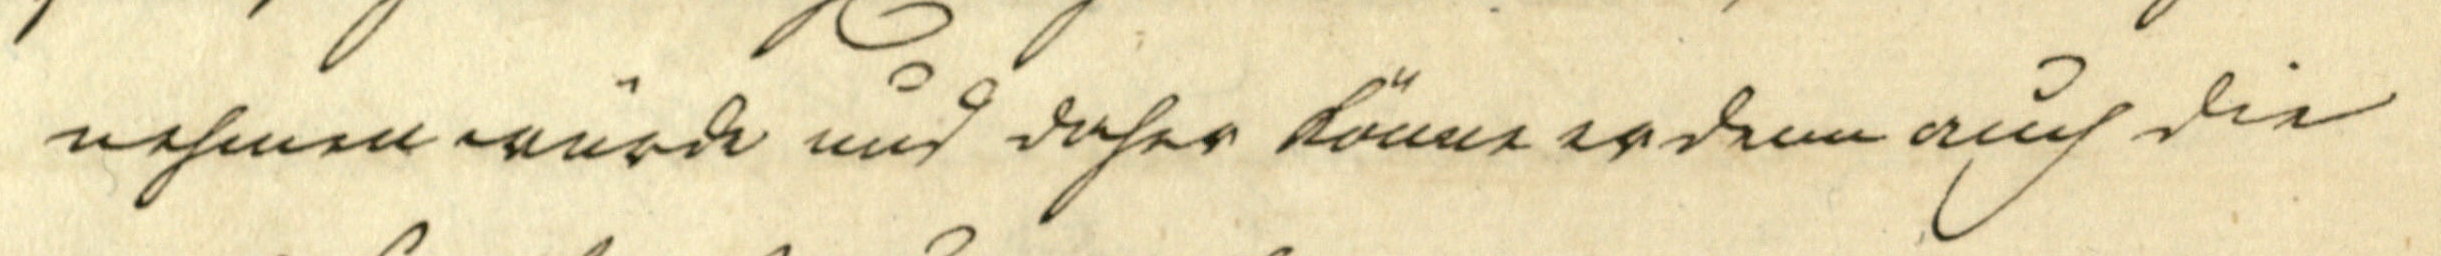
nehmen würde und daher könne er denn auch die
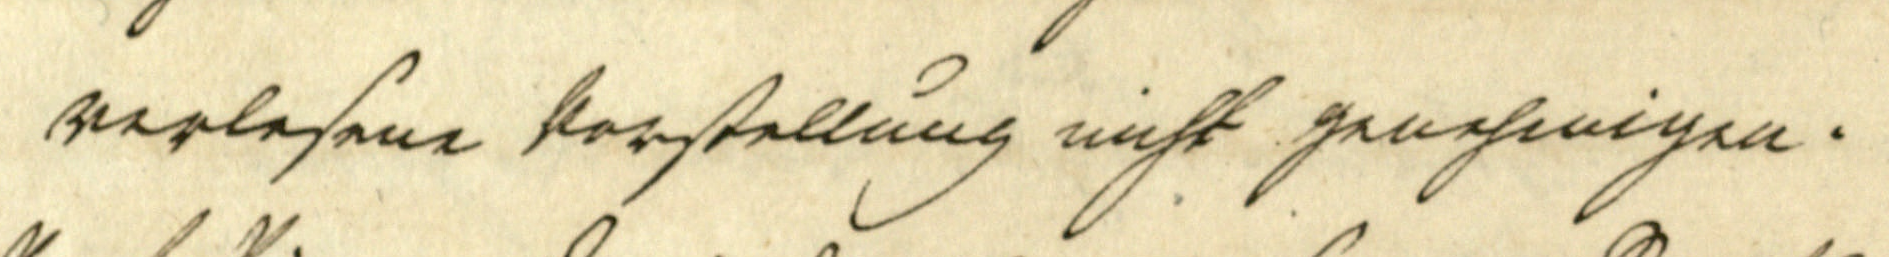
verlesene Vorstellung nicht genehmigen.
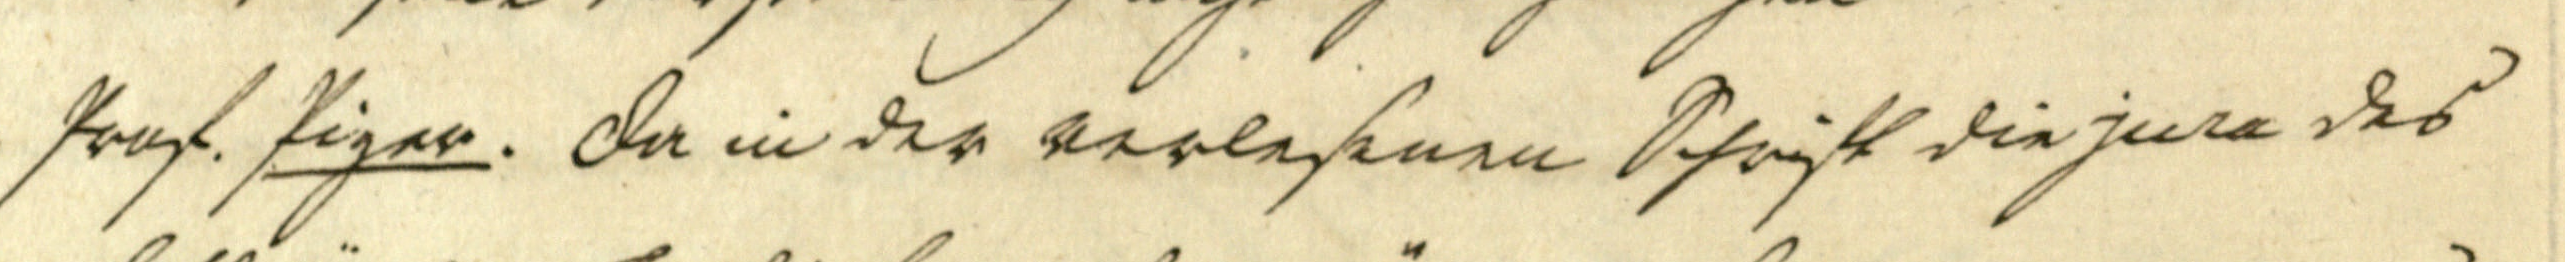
Prof. Piper. Da in der verlesenen Schrift die jura des
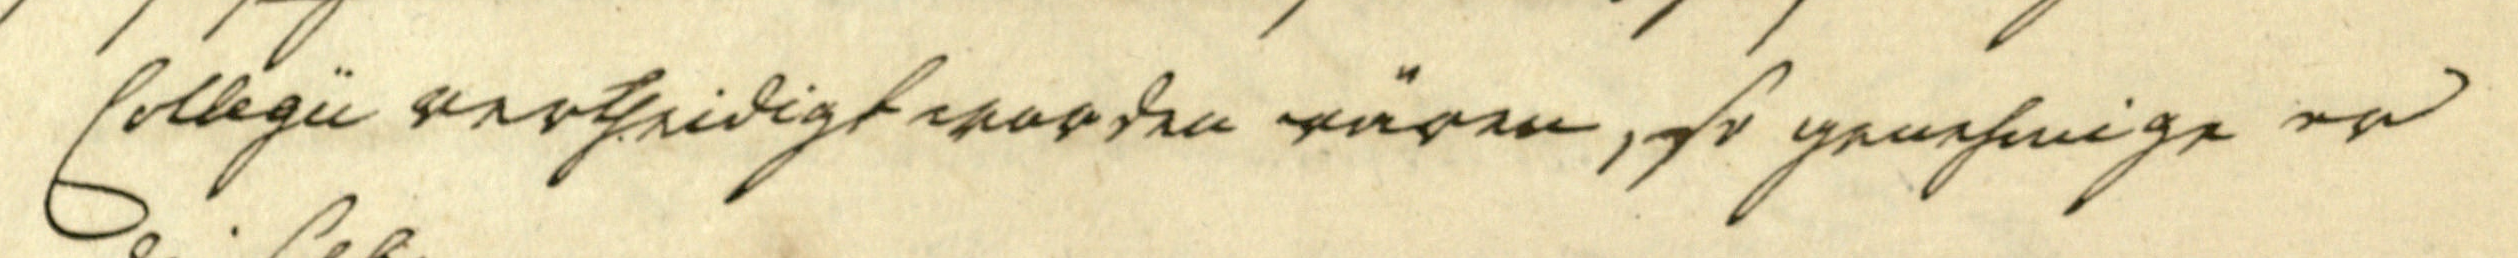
Collegii vertheidigt worden wären, so genehmige er
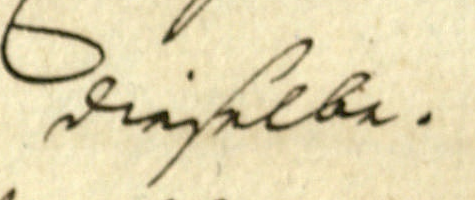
dieselbe.
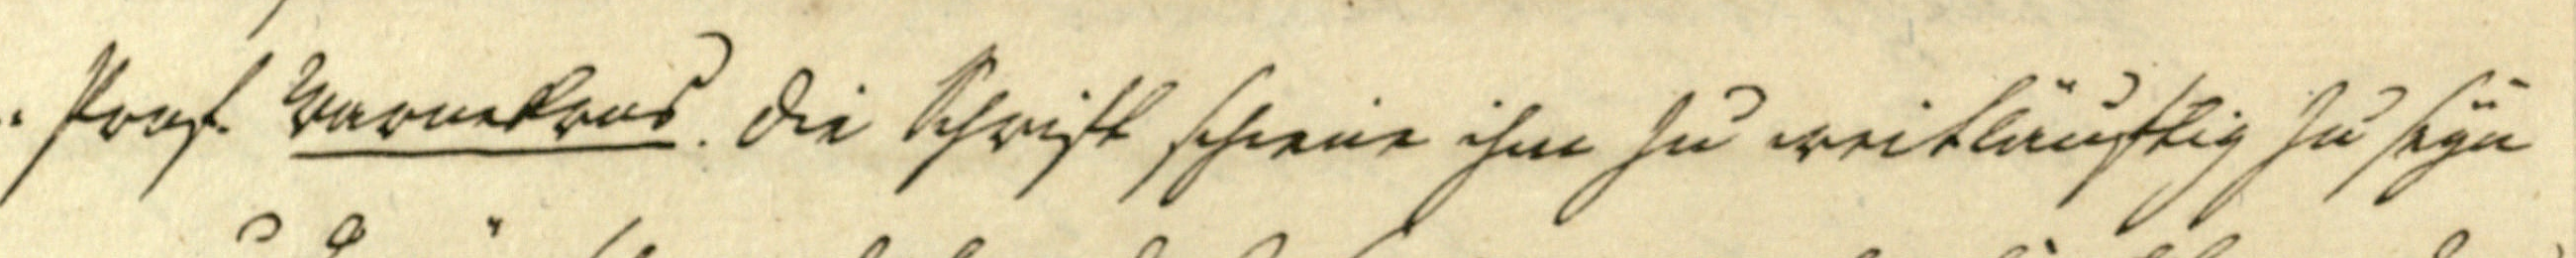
Prof. Warnekros. Die Schrift scheine ihm zu weitläuftig zu seÿn
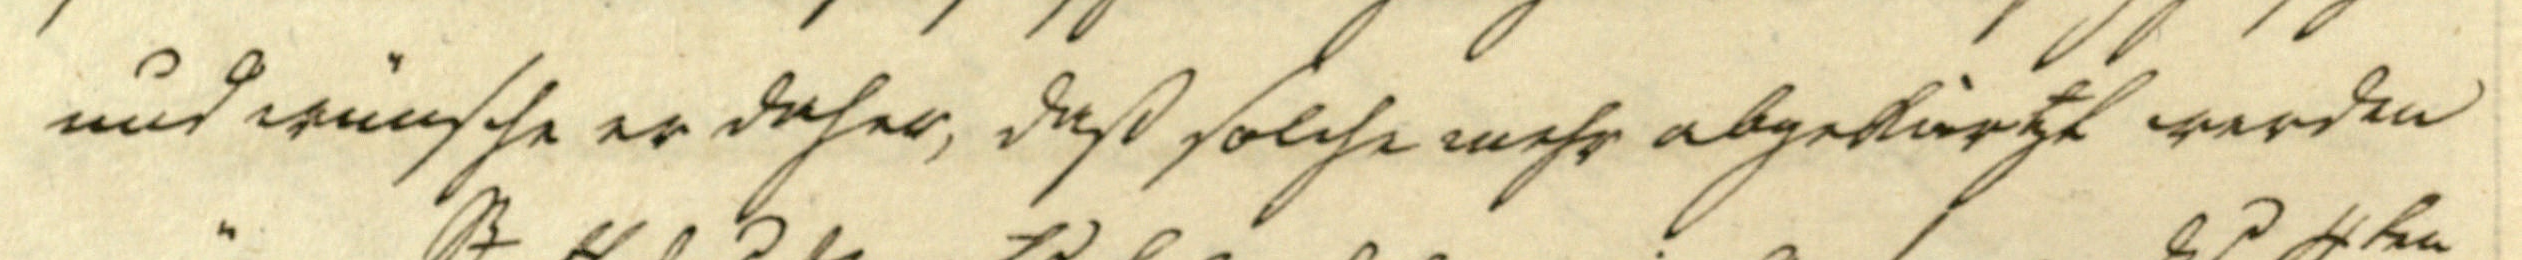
und wünsche er daher, daß solche mehr abgekürtzt werden
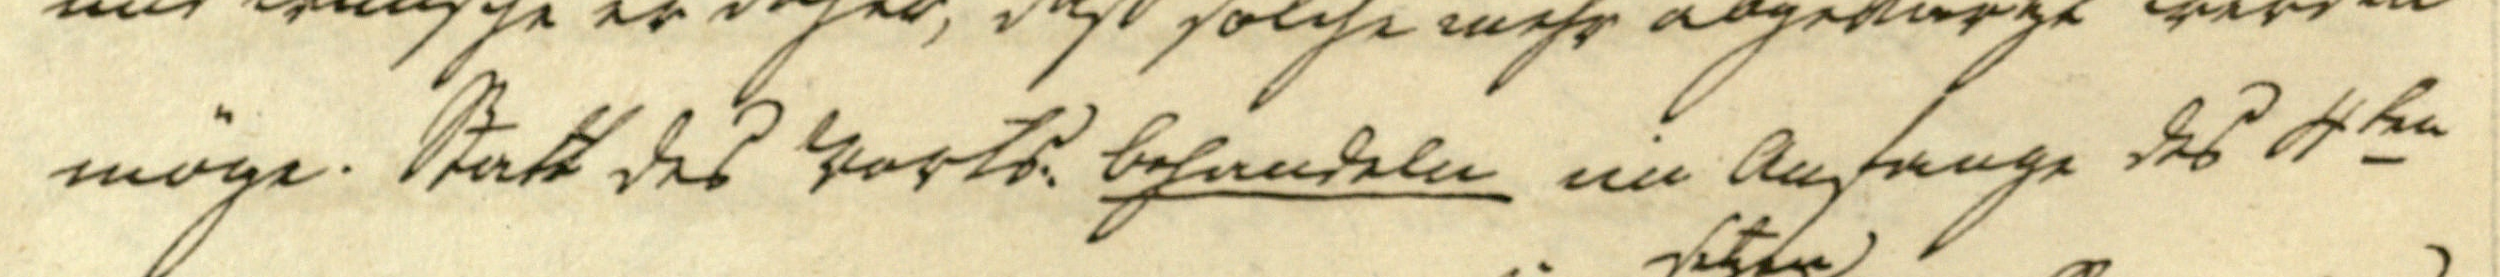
möge. Statt des Worts: behandeln im Anfange des 4. ten
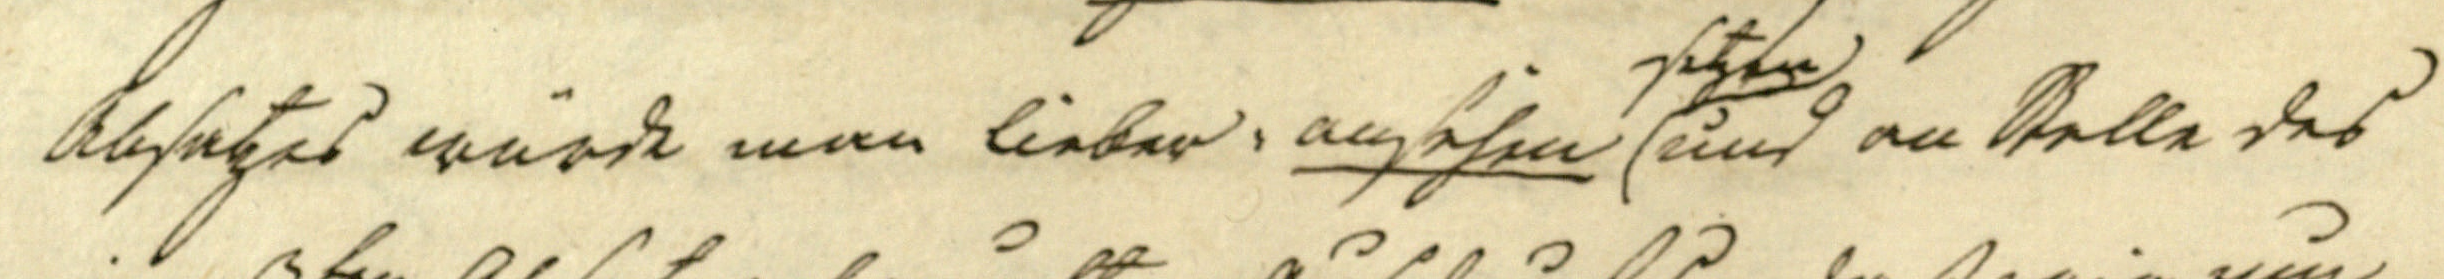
Absatzes würde man lieber: ansehen setzen und an Stelle des
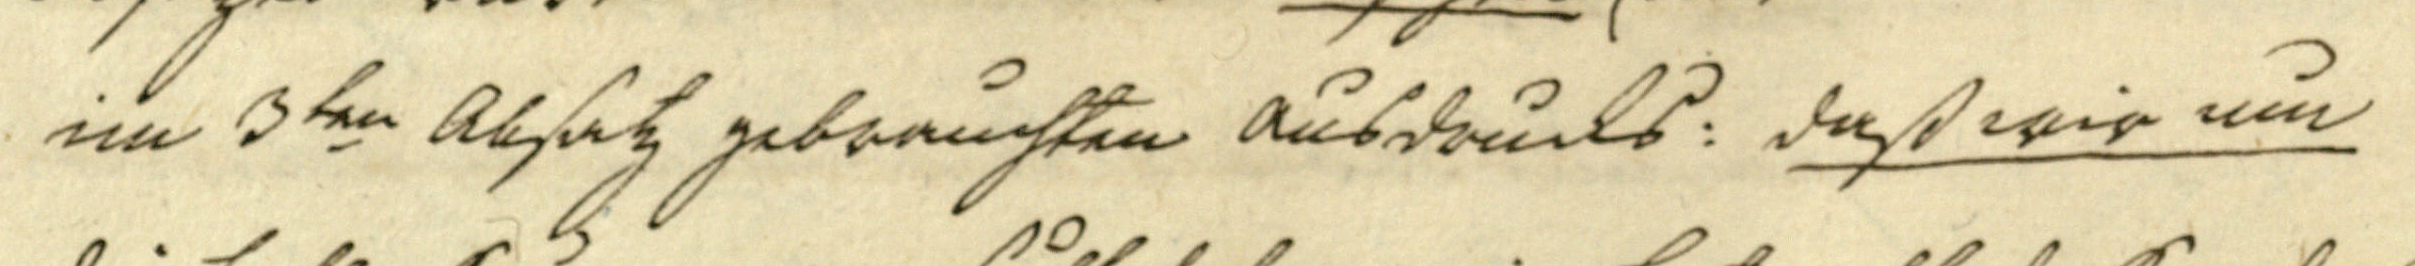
im 3 ten Absatz gebrauchten Ausdrucks: daß wir um
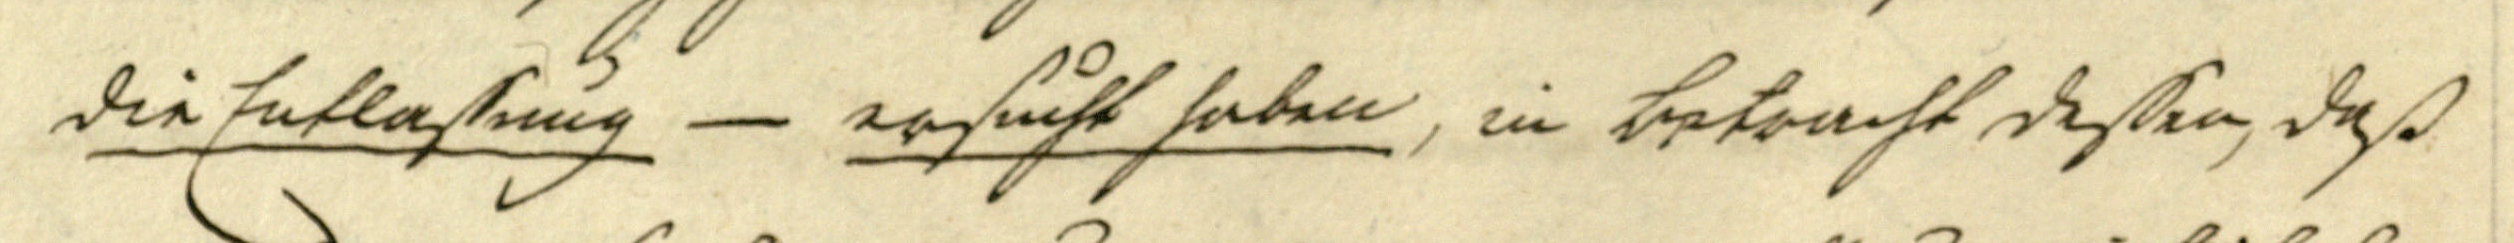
die Entlassung - ersucht haben, in Betracht dessen, daß
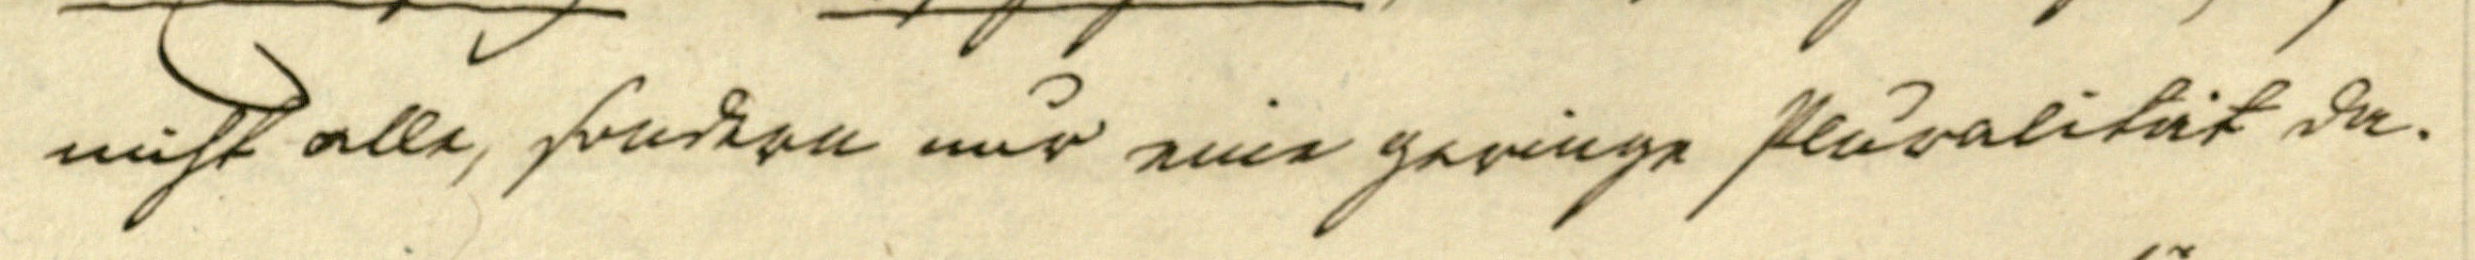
nicht alle, sondern nur eine geringe Pluralität da¬
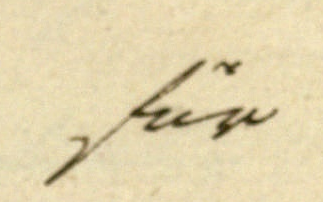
für
